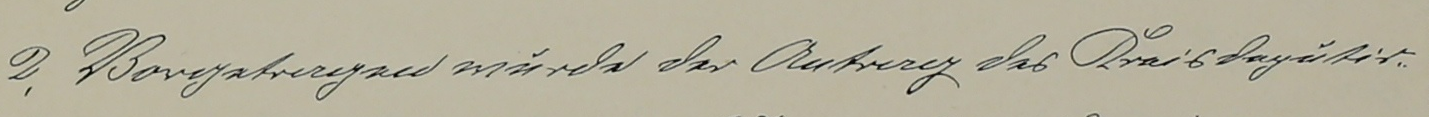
2. Vorgetragen wurde der Antrag des Kreisdeputir-
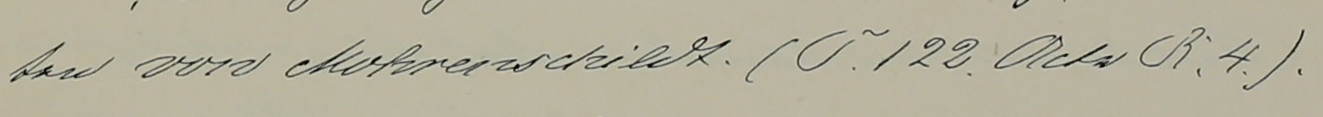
ten von Mohrenschildt. (T.122. Acte R.4.).
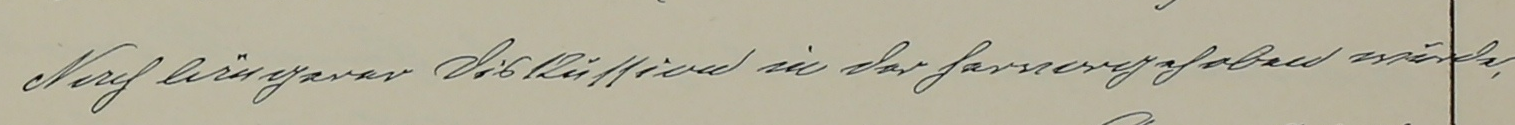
Nach längerer Diskussion in der hervorgehoben wurde,
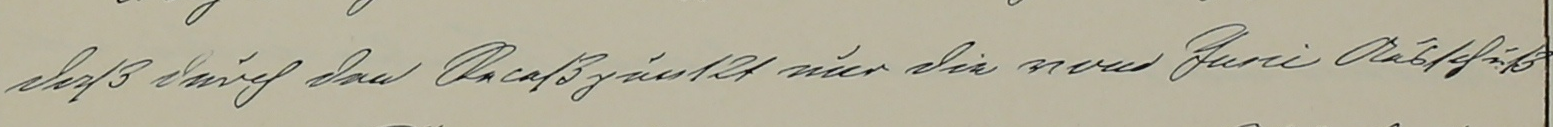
daß durch den Receßpunkt nur die vom Juni Ausschuß
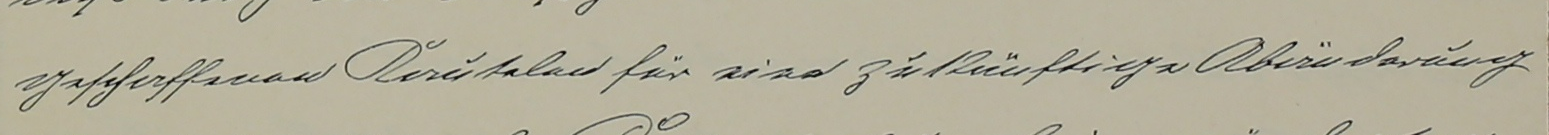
geschaffenen Kautelen für eine zukünftige Abänderung
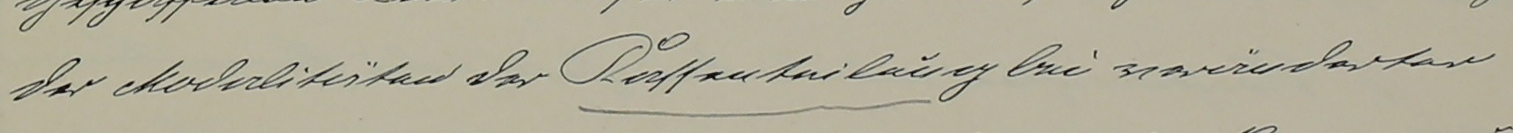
der Modalitäten der Kassenteilung bei veränderter
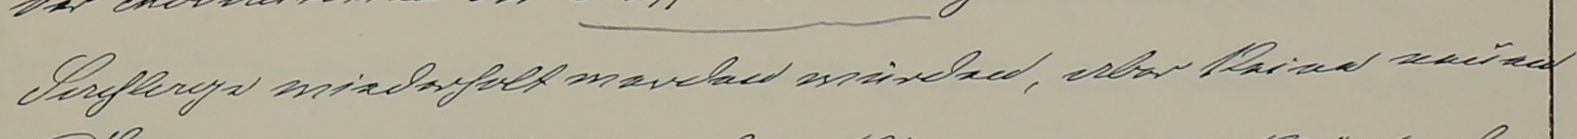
Sachlage wiederholt werden würden, aber keine neuen
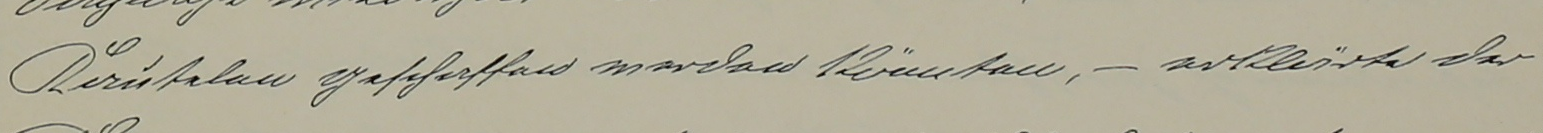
Kautelen geschaffen werden könnten, - erklärte der
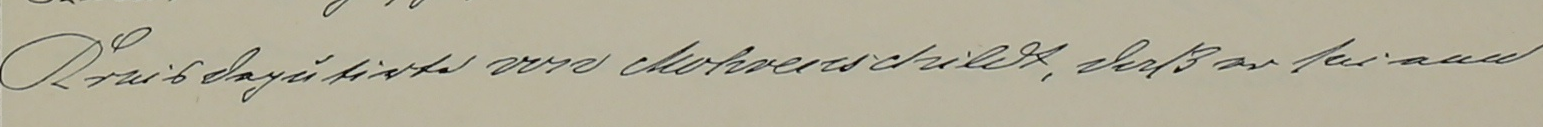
Kreisdeputirte von Mohrenschildt, daß er seinen
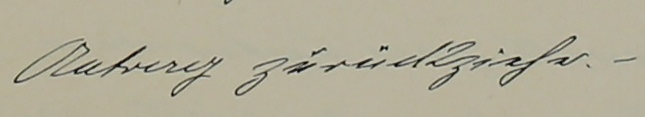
Antrag zurückziehe.
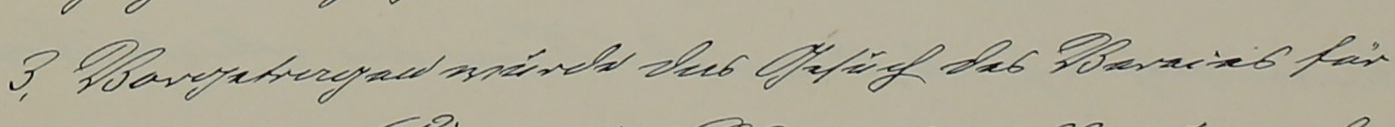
3. Vorgetragen wurde das Gesuch des Vereins für
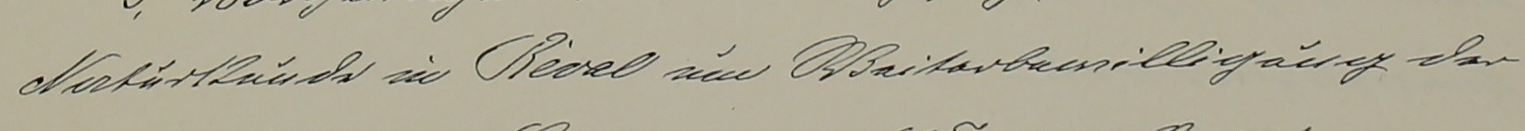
Naturkunde in Reval um Weiterbewilligung der
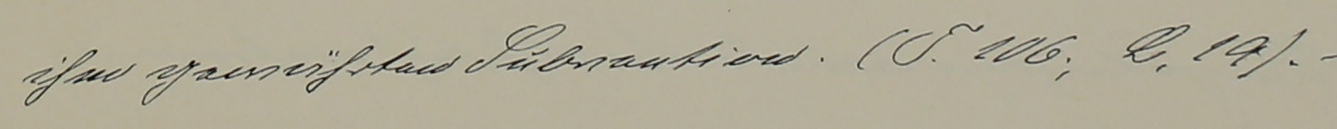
ihm gewährten Subvention. (T.106; L.19).
